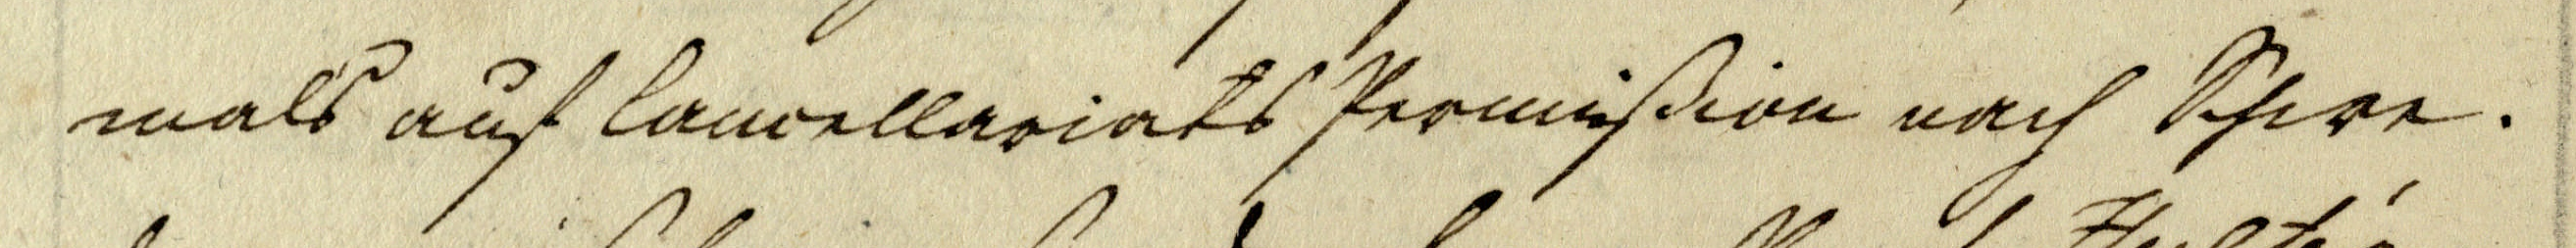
mals auf Cancellariats Permißion nach Schwe¬
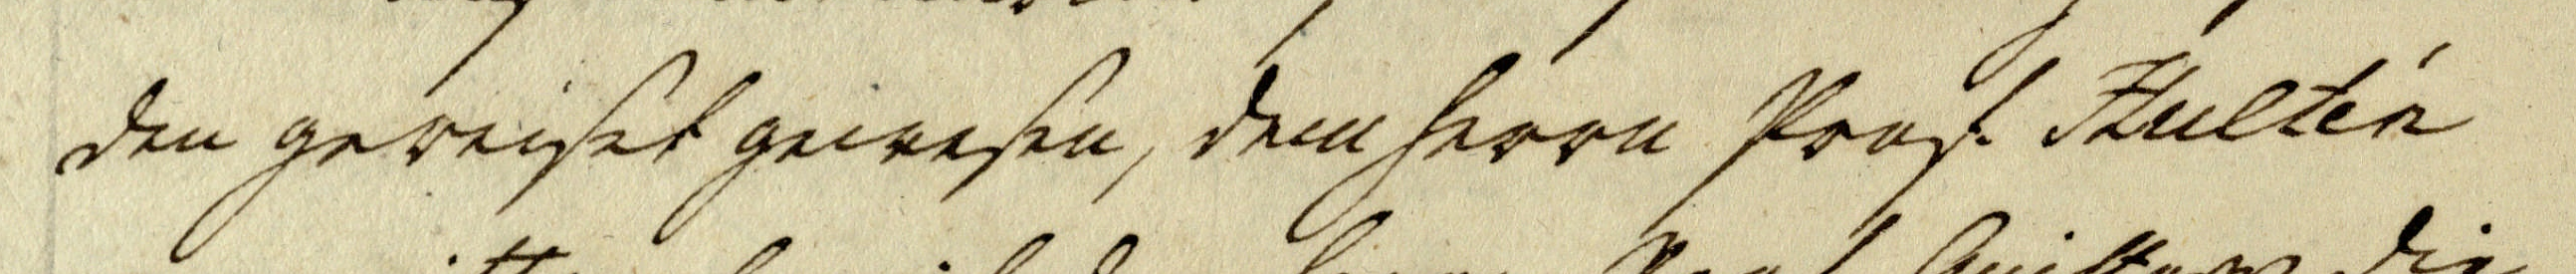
den gereiset gewesen, dem Herrn Prof Hultén
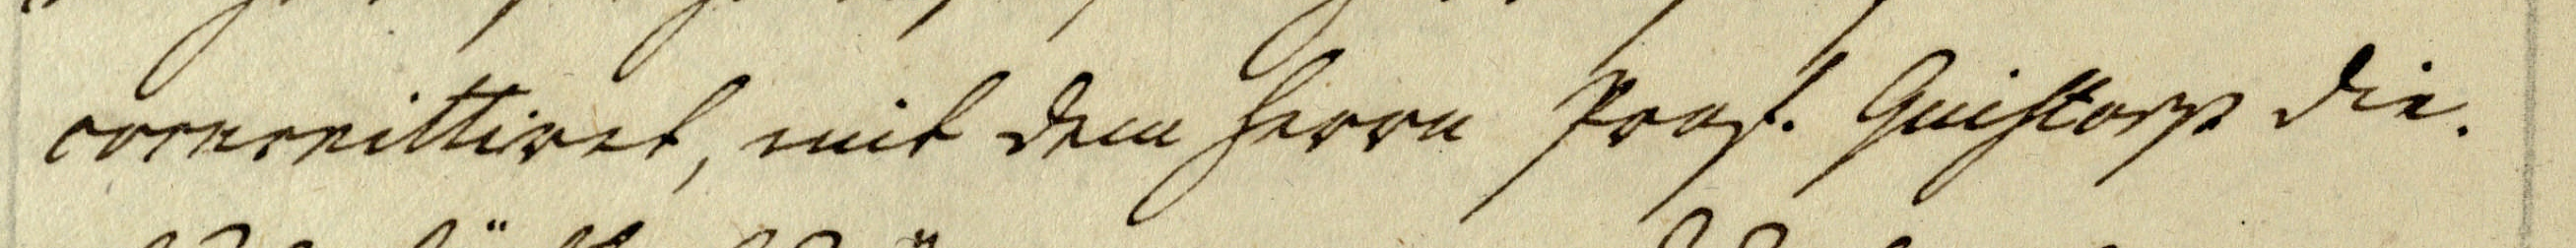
committiret, mit dem Herrn Prof. Quistorp die¬
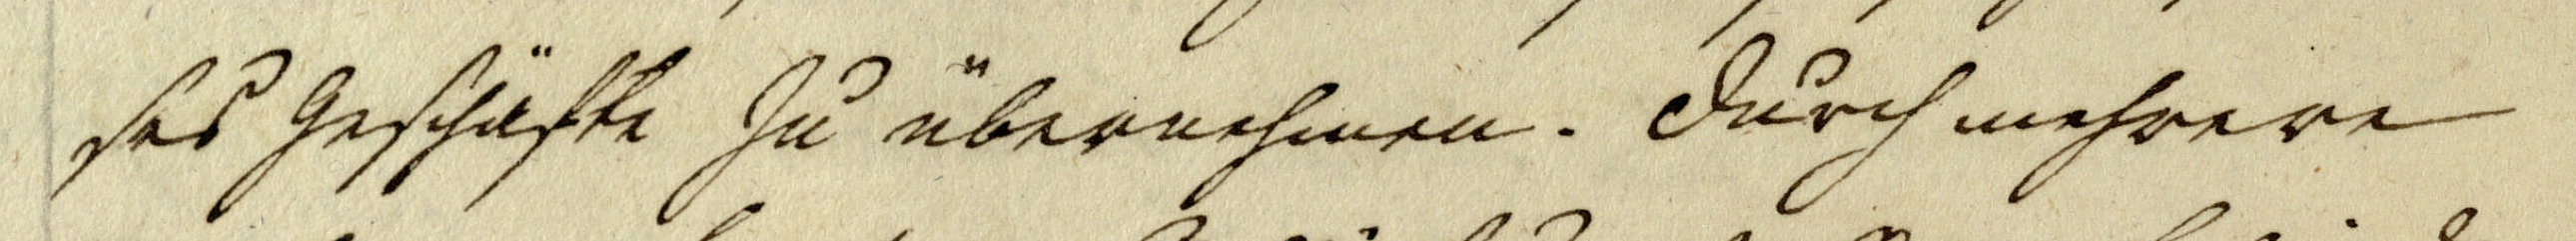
ses Geschäfte zu übernehmen. Durch mehrere
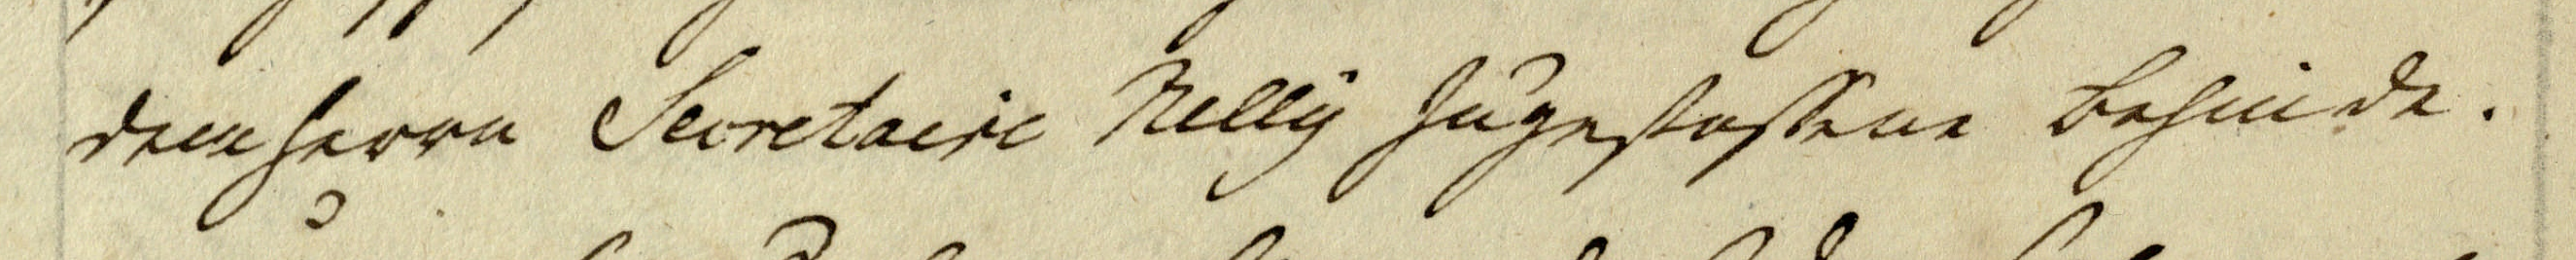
dem Herrn Secretaire Nelly zugestossene Behinde¬
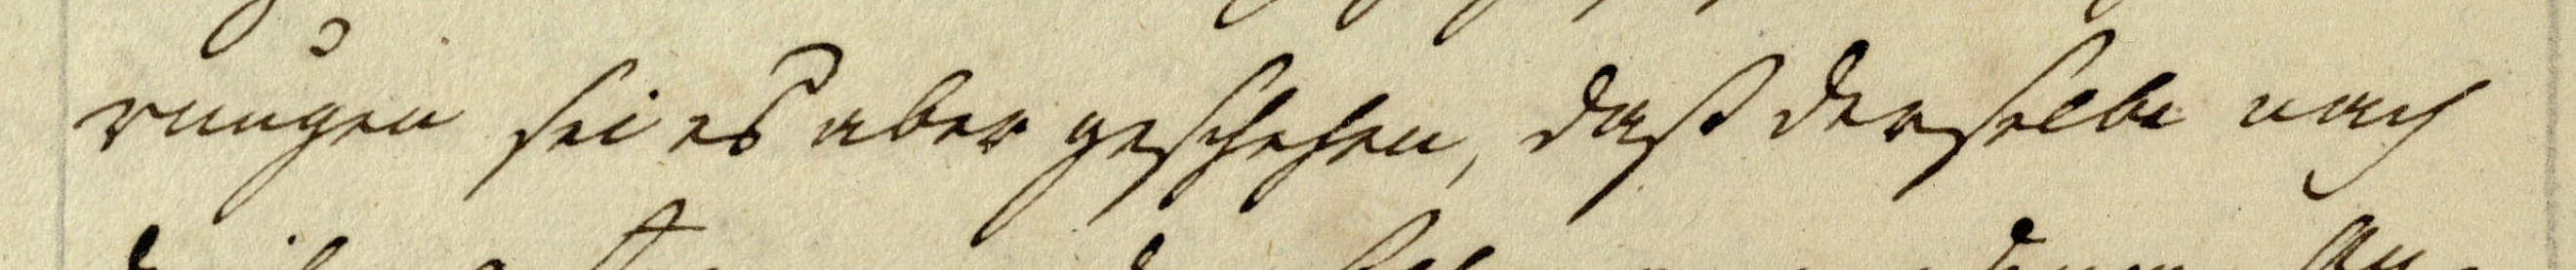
rungen sei es aber geschehen, daß derselbe nach
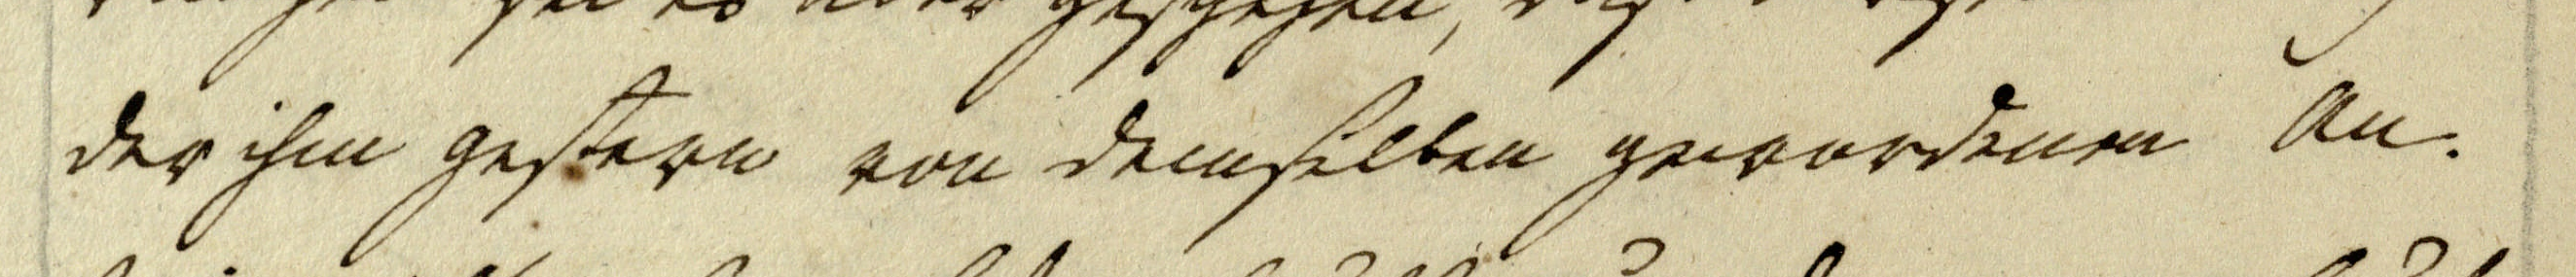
der ihm gestern von demselben gewordenen An¬
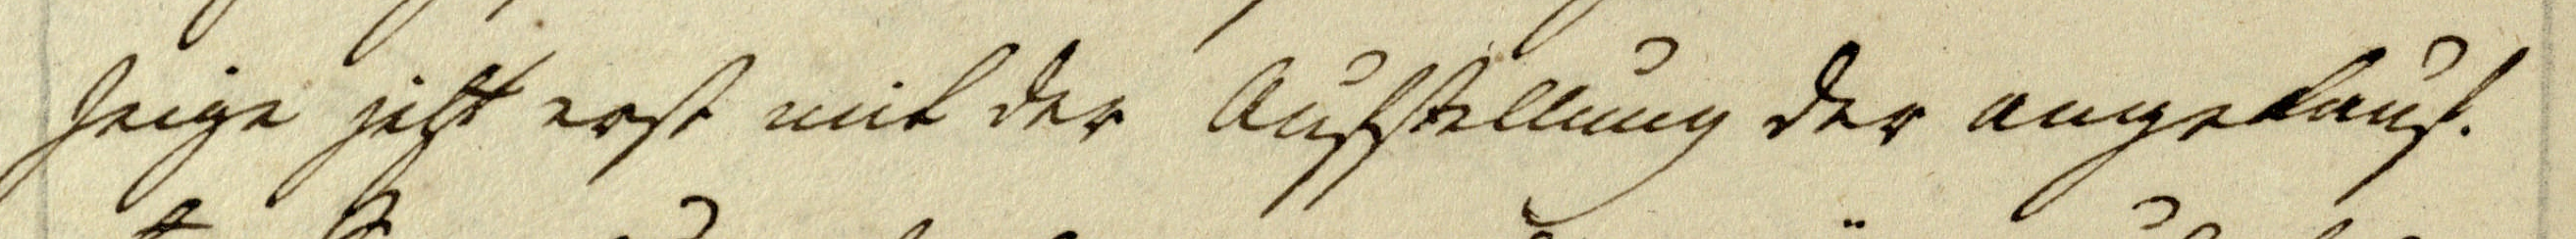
zeige jetzt erst mit der Aufstellung der angekauf¬
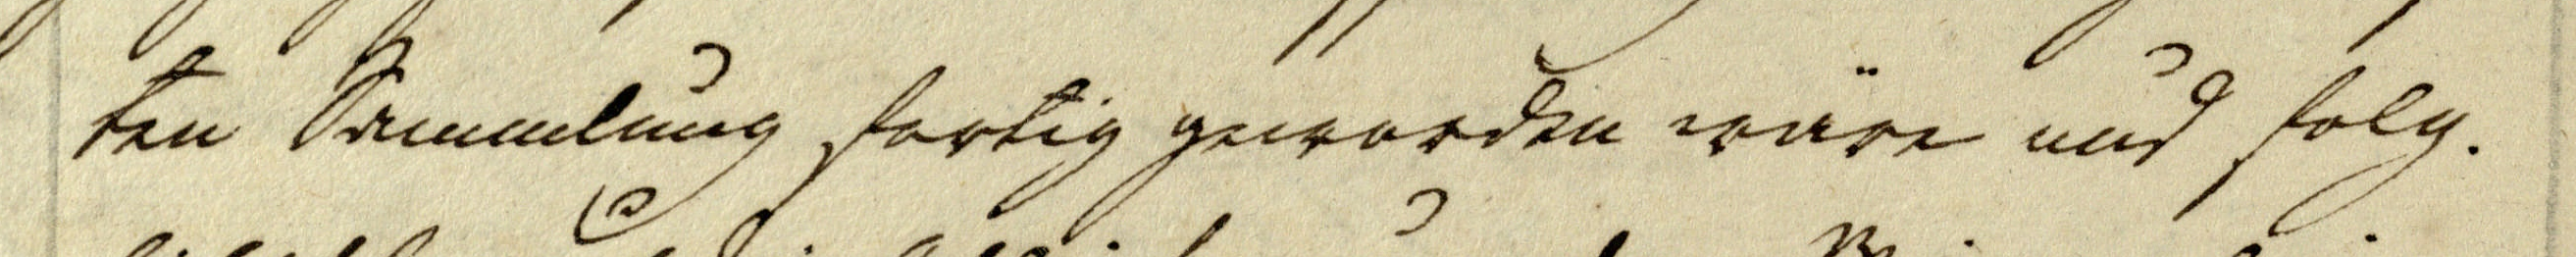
ten Sammlung fertig geworden wäre und folg¬
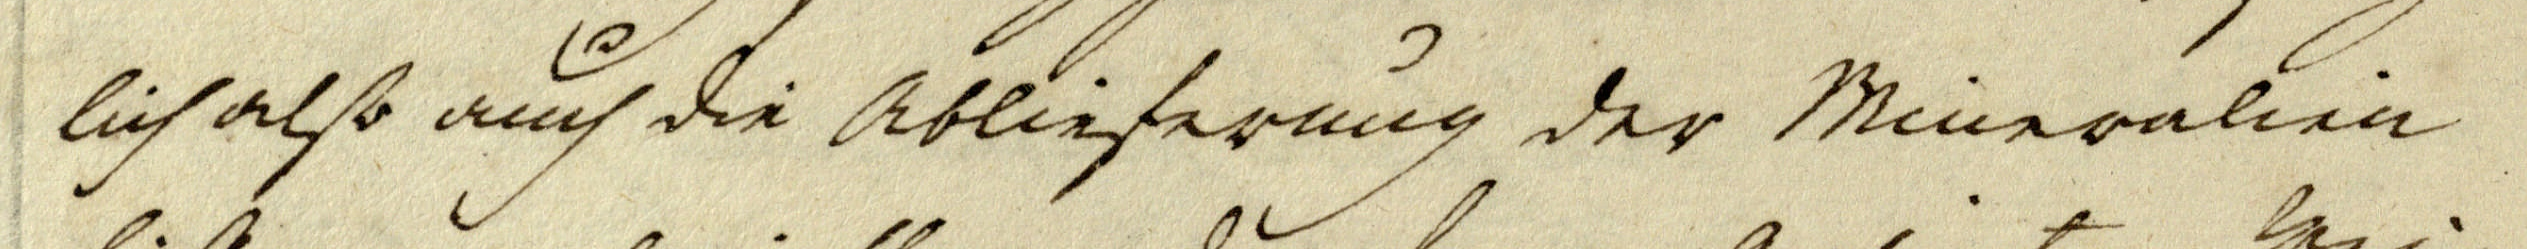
lich also auch die Ablieferung der Mineralien
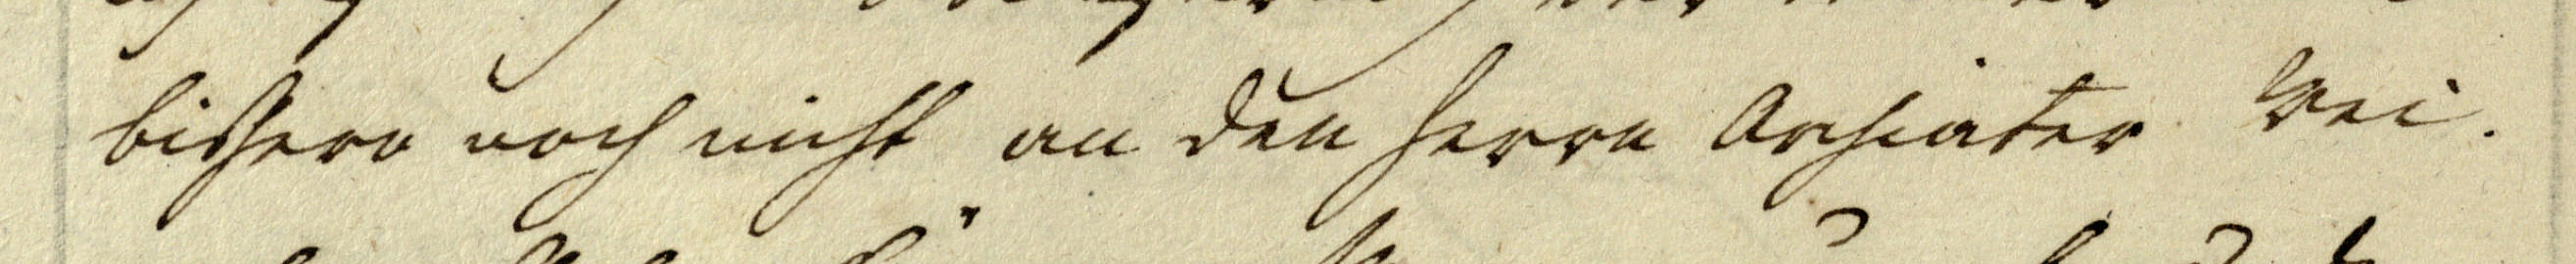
bishero noch nicht an den Herrn Archiater Wei¬
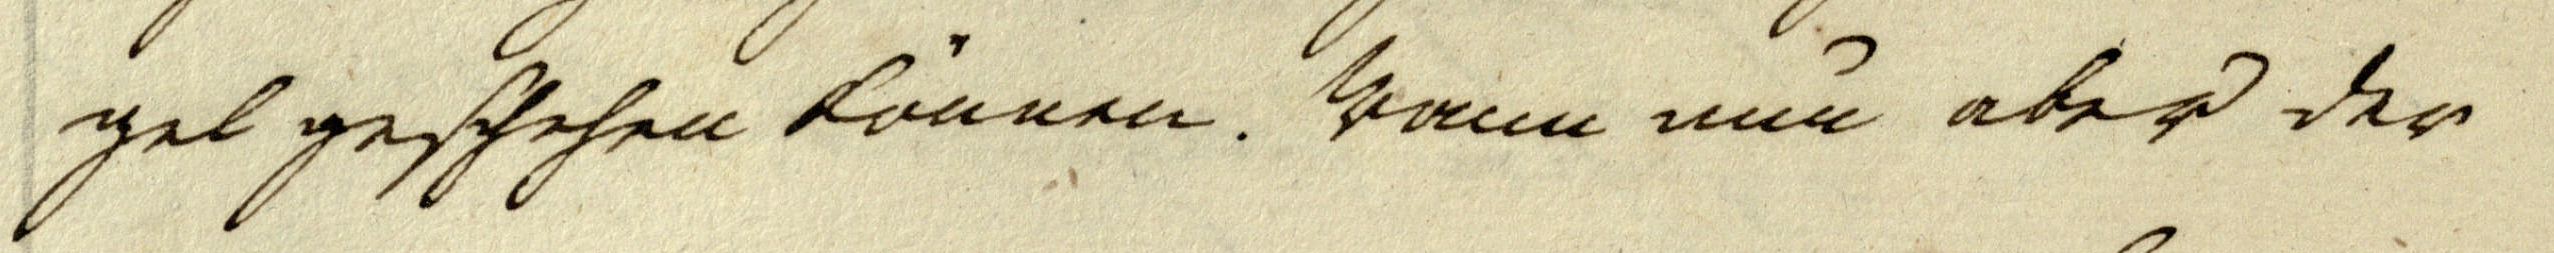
gel geschehen können. Wann nun aber der
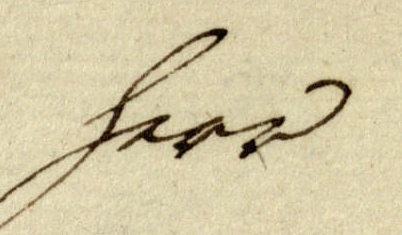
Herr
